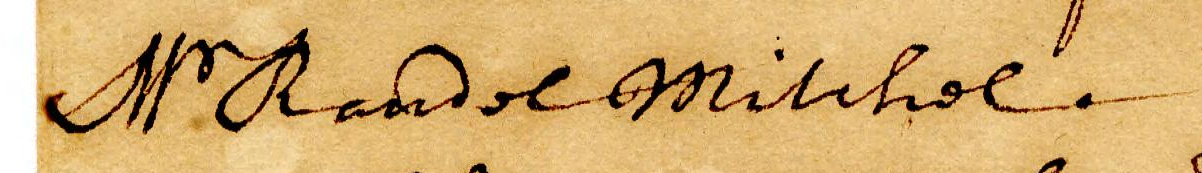M^r Randel Mitchel.
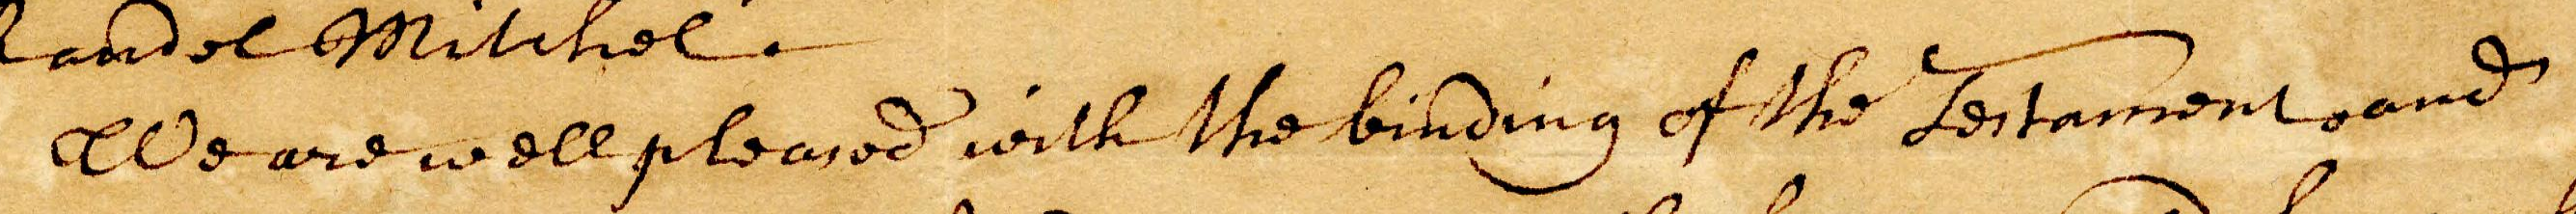We are well pleased with the binding of the Testaments and
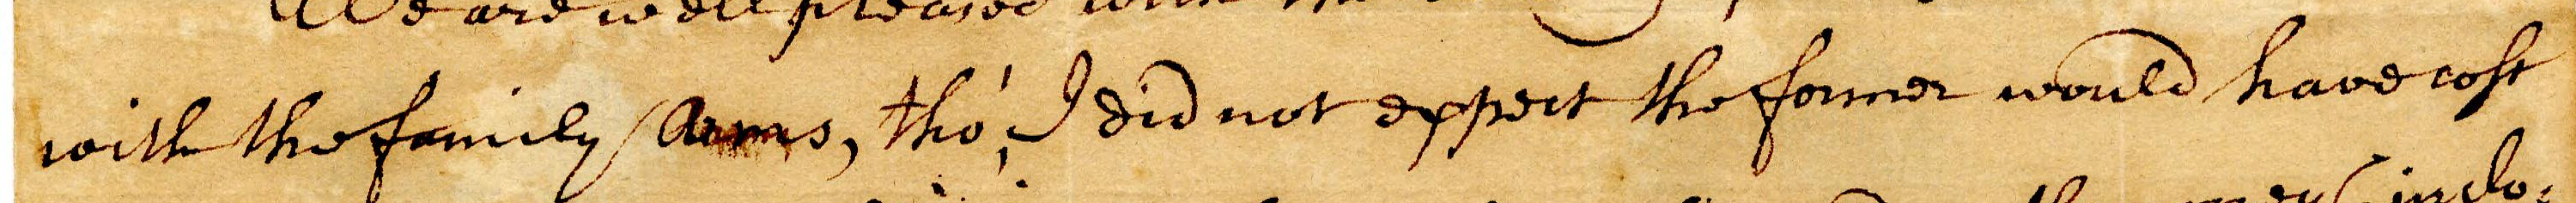with the family Arms, tho', I did not expect the former would have cost
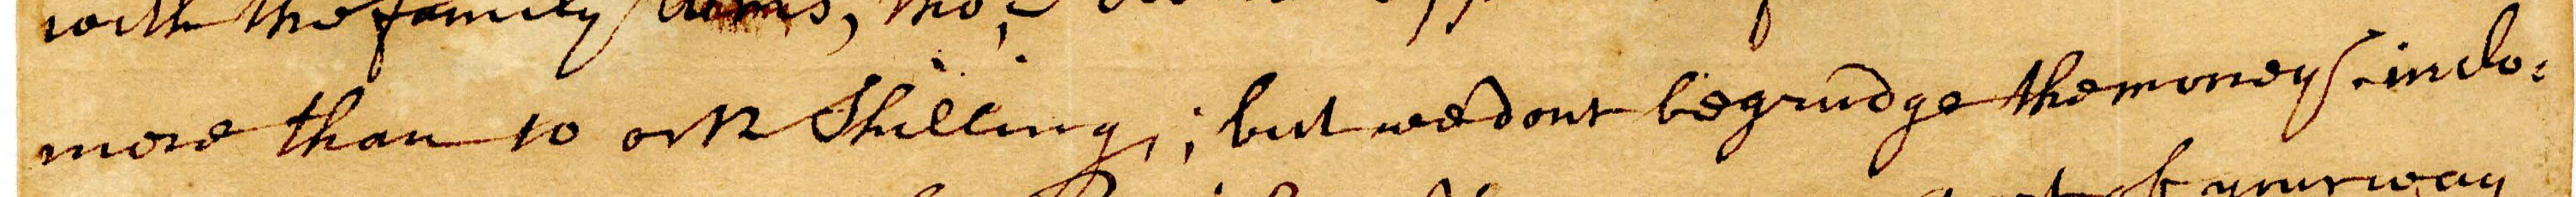more than 10 or 12 Shillings; but we dont begrudge the money-inclo:
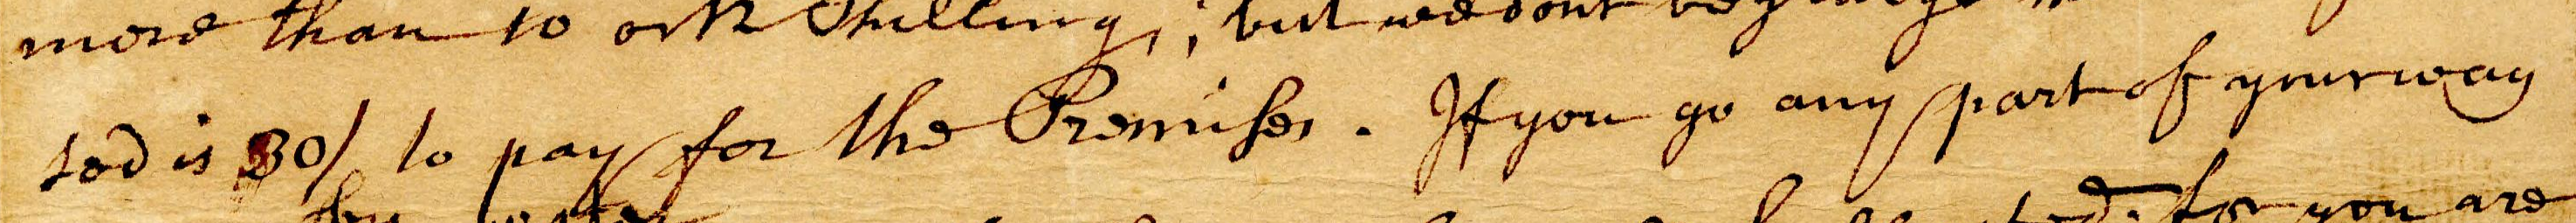sed is 30s to pay for the Premises. If you go any part of your way
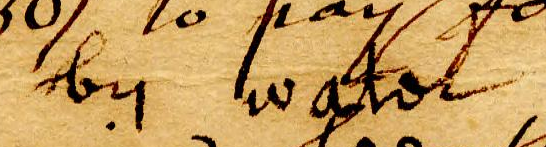by water
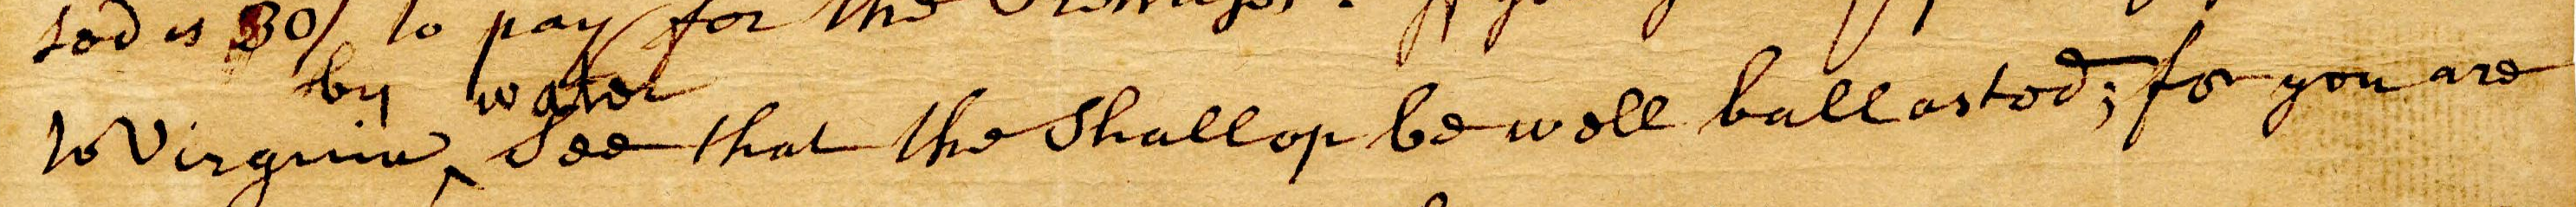to Virginia ^ see that the shallop be well ballasted; for you are
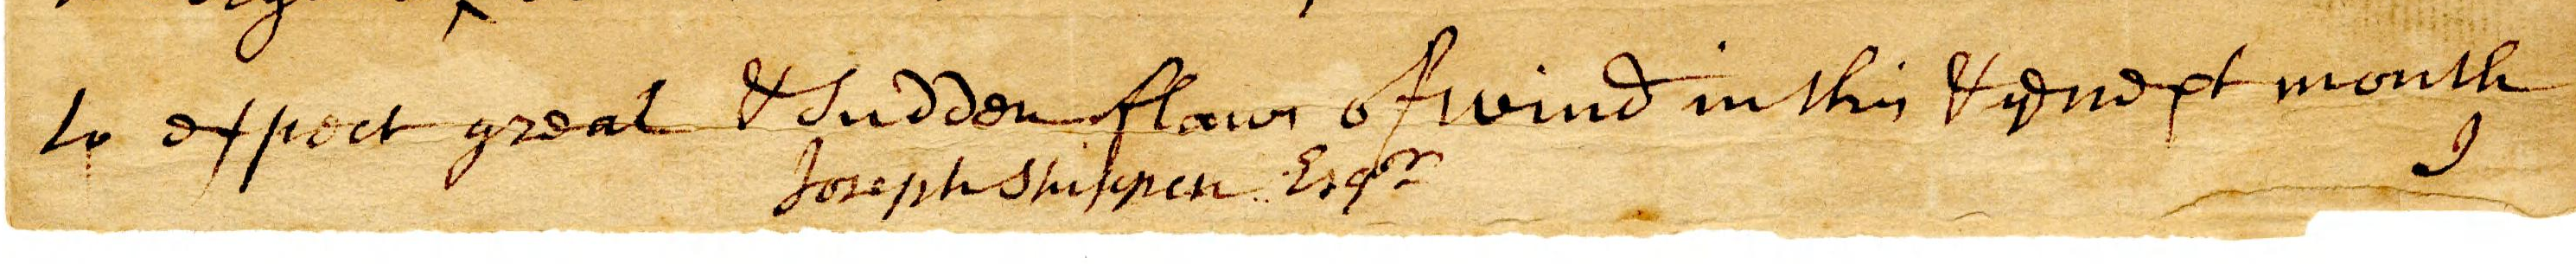to expect great & sudden flows of wind in this & end of month
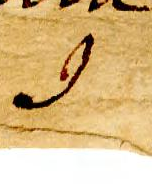I
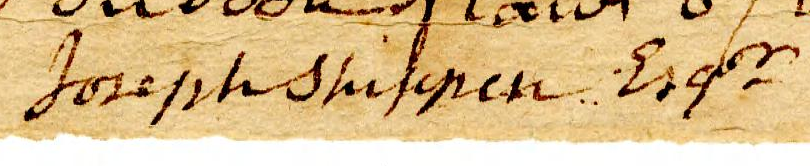Joseph Shippen Esq^r
